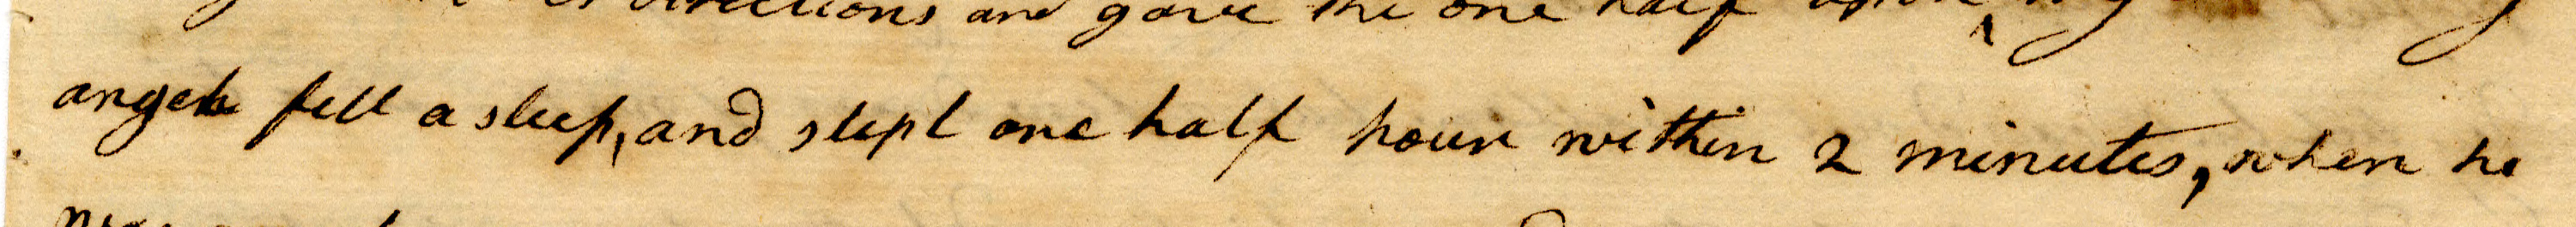angel fell a sleep, and slept one half hour within 2 minutes, when he
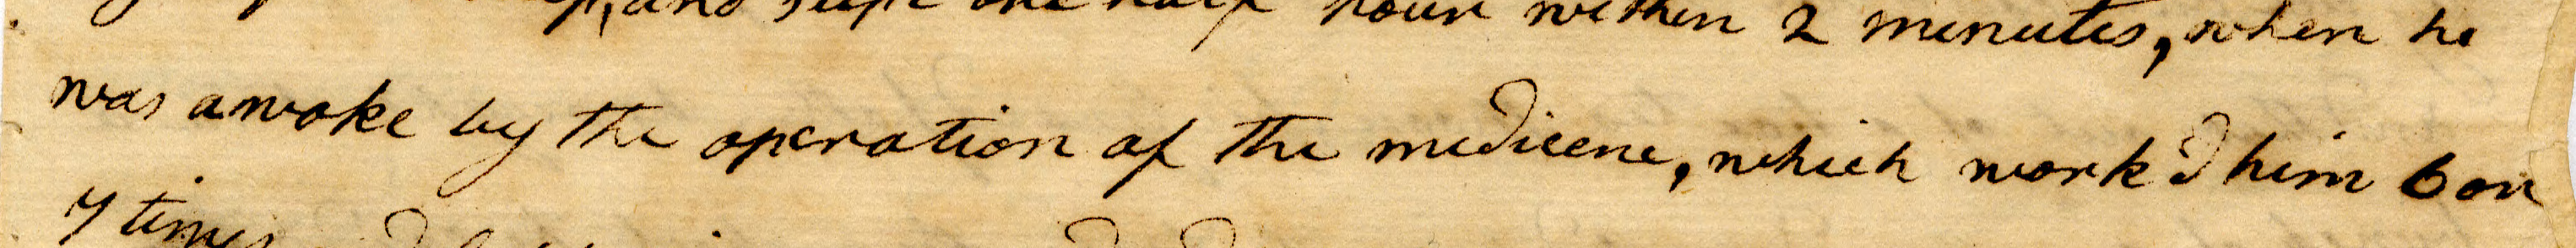was awoke by the operation of the medicine, which workd him bou
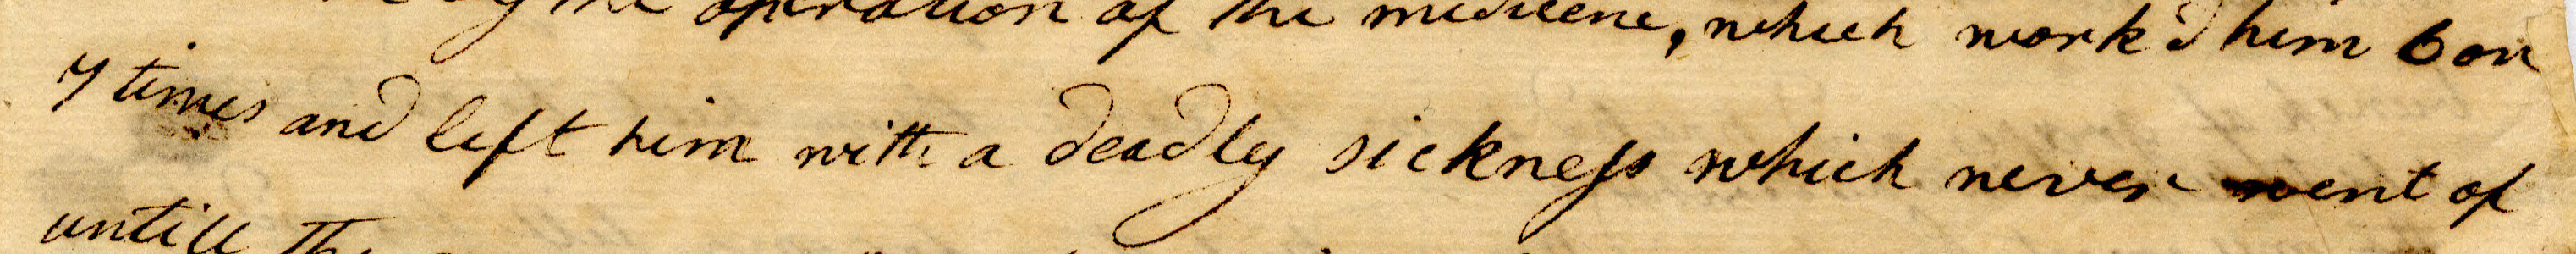7 times and left him with a deadly sickness which never went of
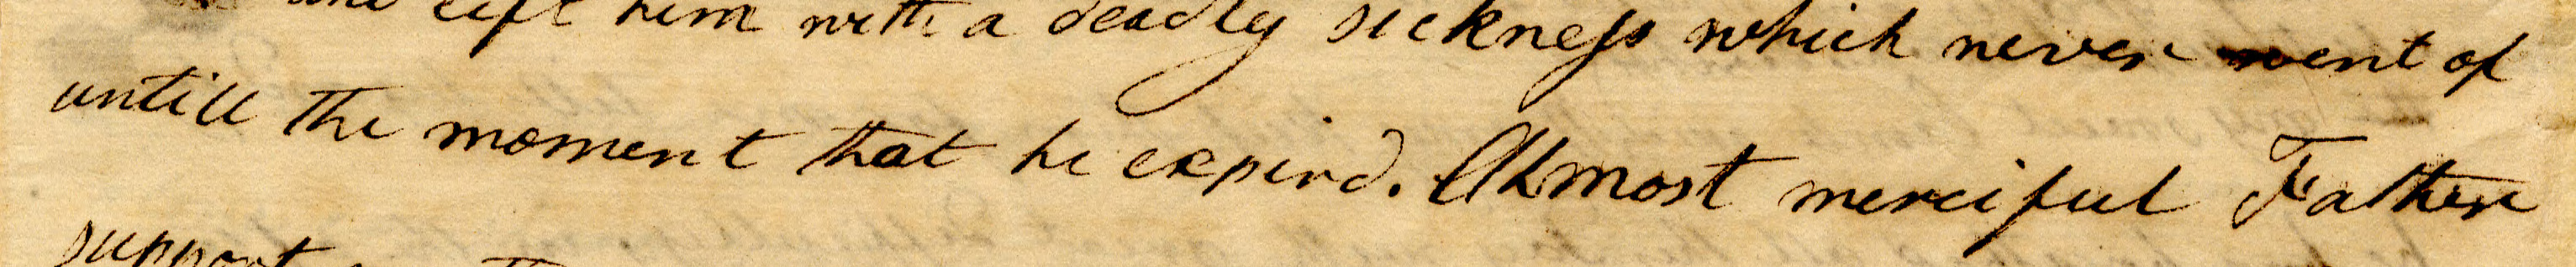untill the moment that he expird. Oh most merciful Father
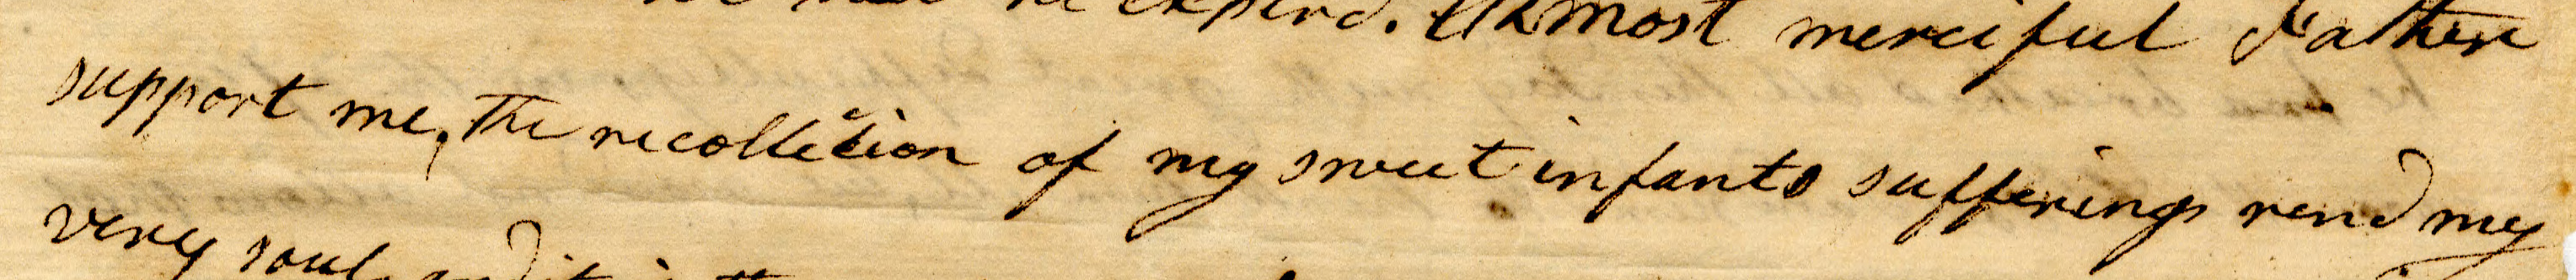support me. The recollection of my sweet infants sufferings rend my
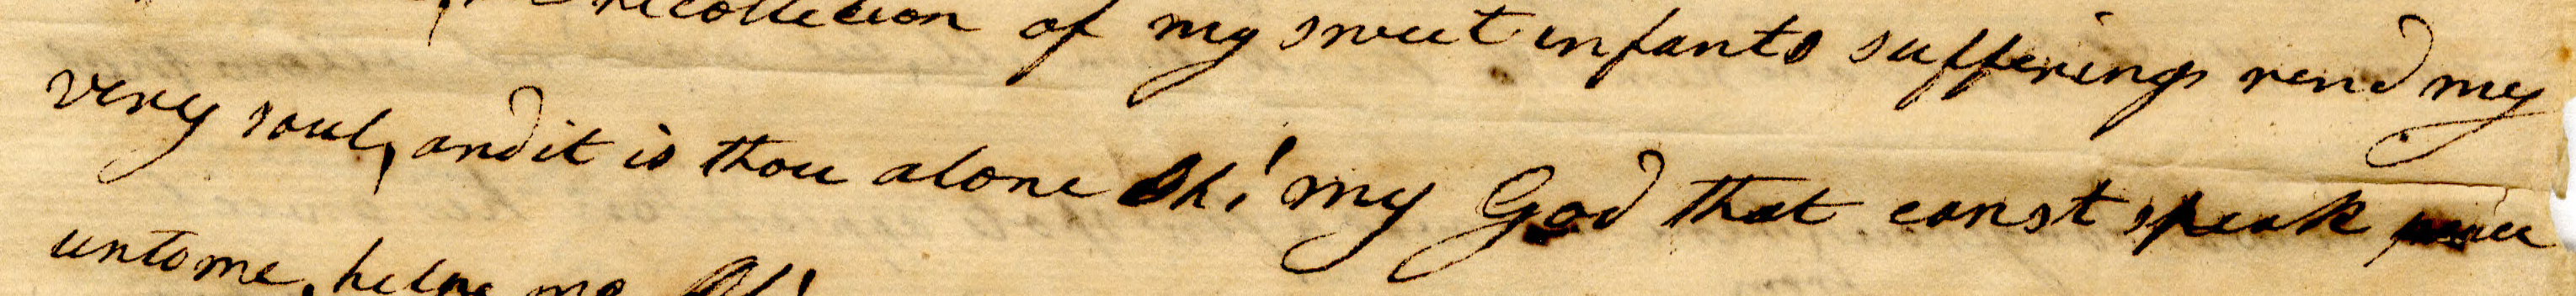very soul, and it is thou alone Oh! my God that canst speak peace
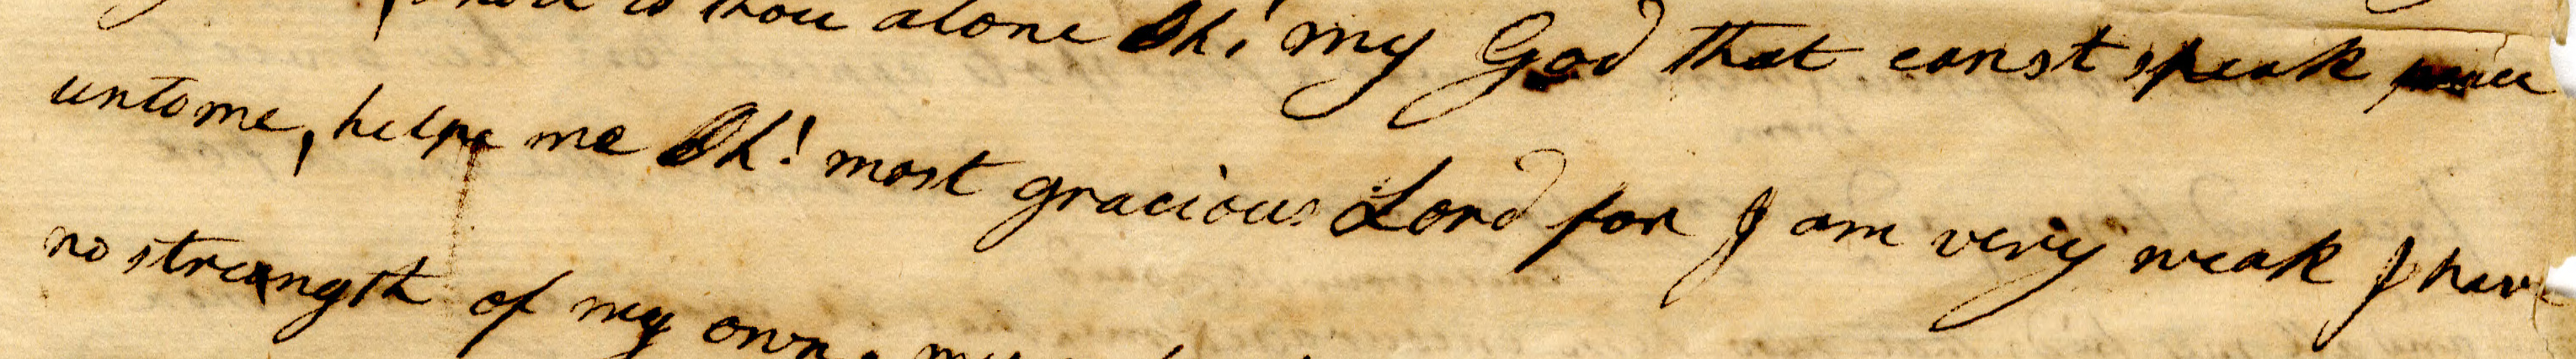unto me, help me Oh! most gracious Lord for I am very weak I have
